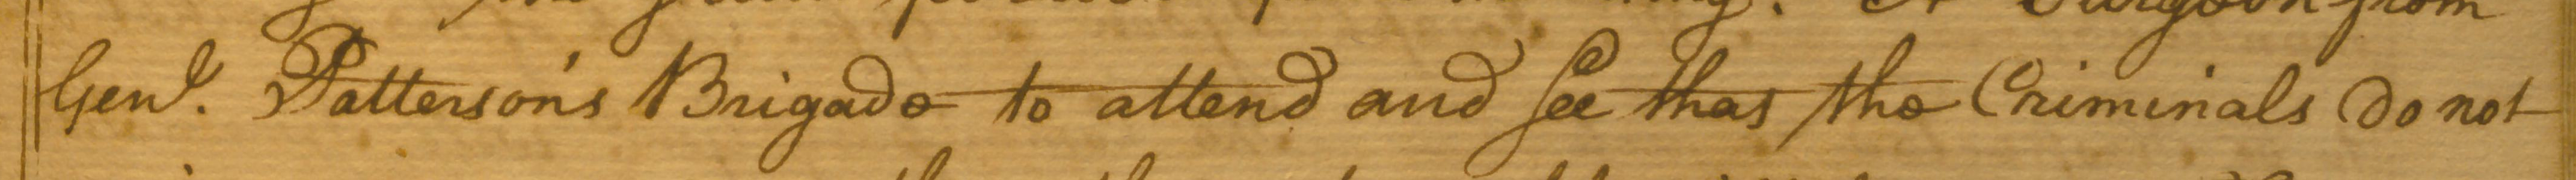Gen^l. Patterson's Brigade to attend and see that the Criminals do not
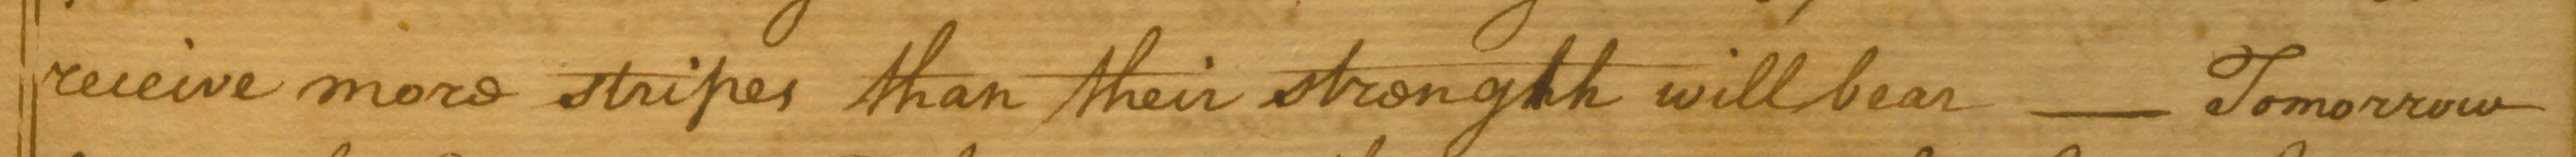receive more stripes than their strength will bear- Tomorrow
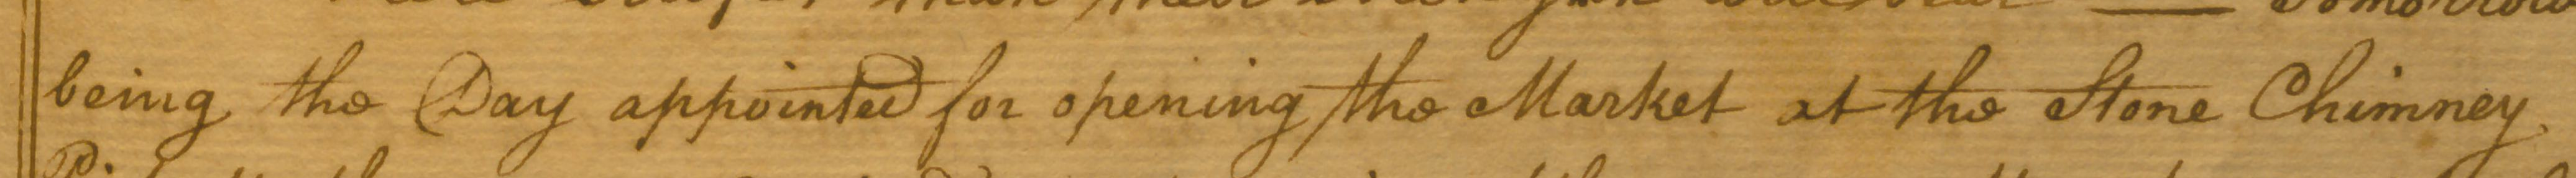being the Day appointed for opening the Market at the Stone Chimney
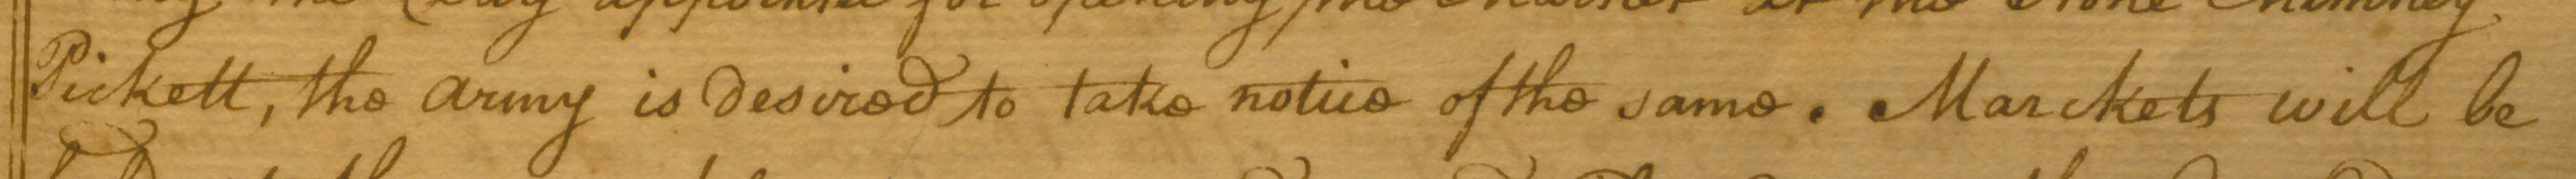Pickett, the army is desired to take notice of the same. Markets will be
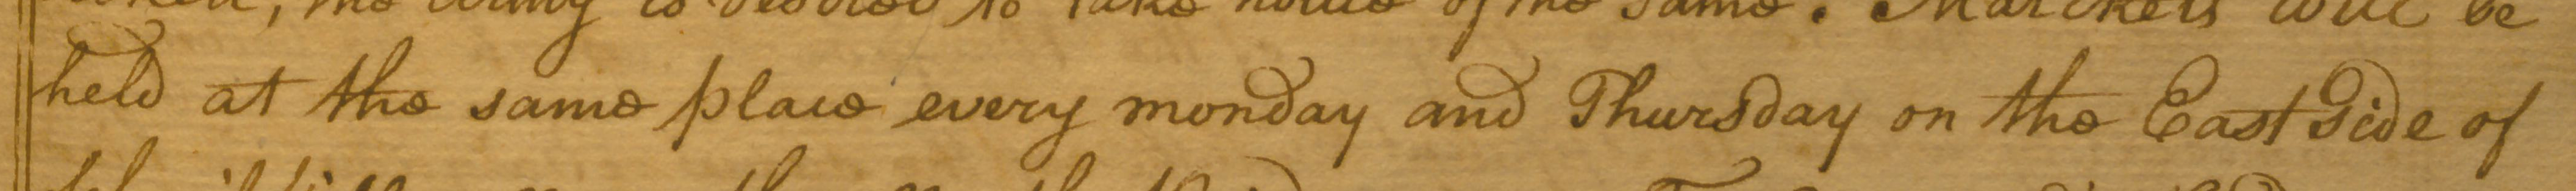held at the same place every monday and Thursday on the East Side of
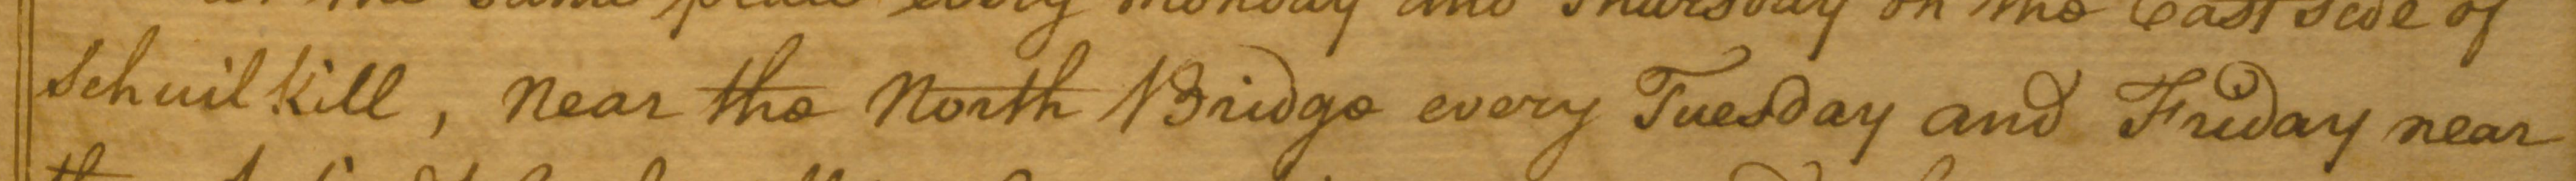Schuikill, near the North Bridge every Tuesday and Friday near
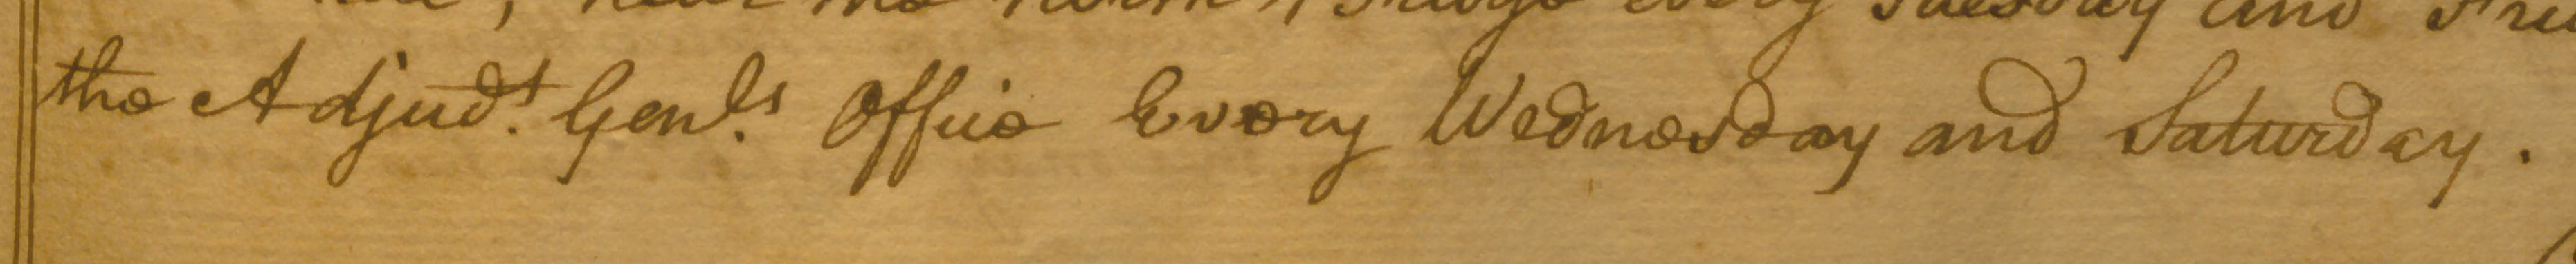the Adjud^t. Gen^ls. Office Every Wednesday and Saturday.
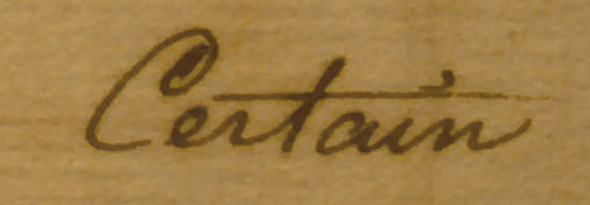Certain
